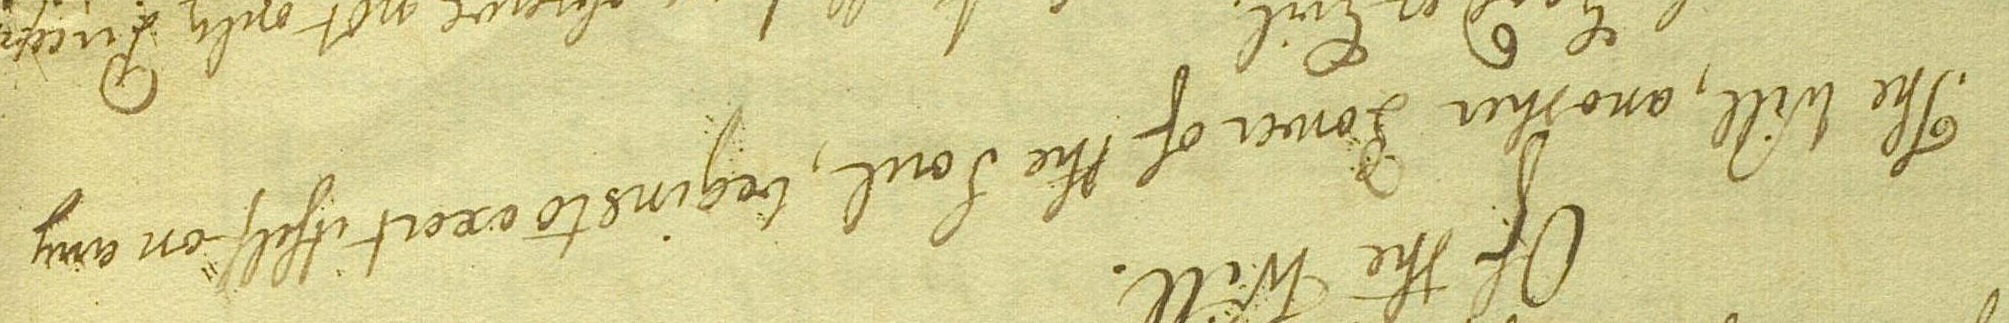The Will, another Power of the Soul, begins to exert itself on any
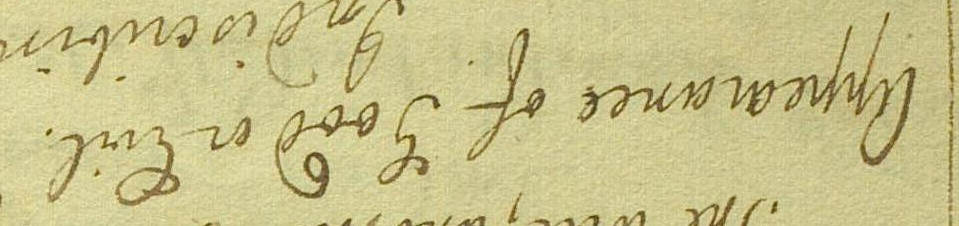Appearance of Good or Evil.
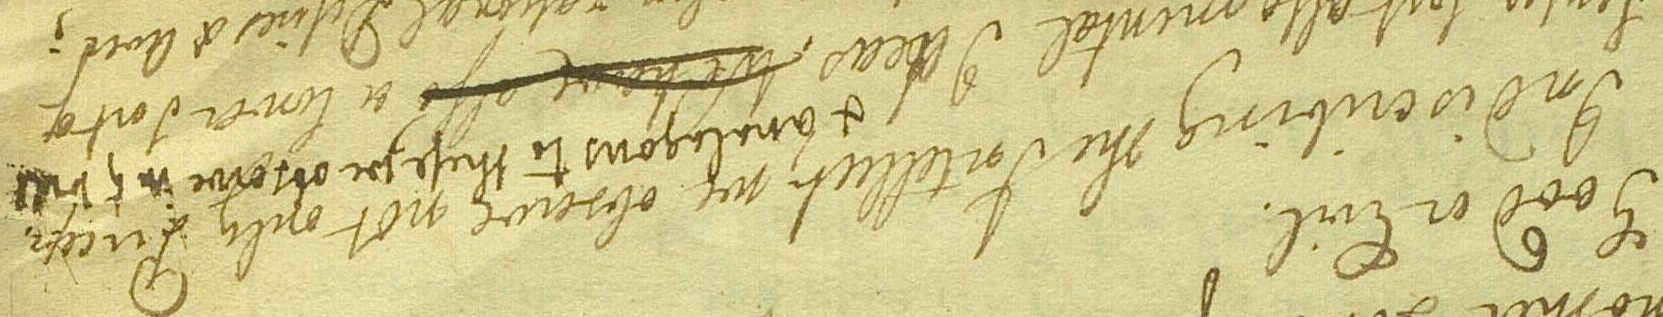In discribing the Intellect, we observe not only Percep
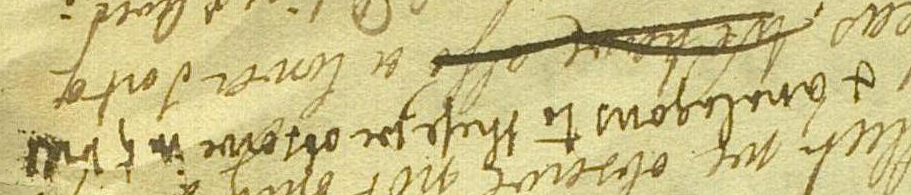& analagous to these we observe in [_____]
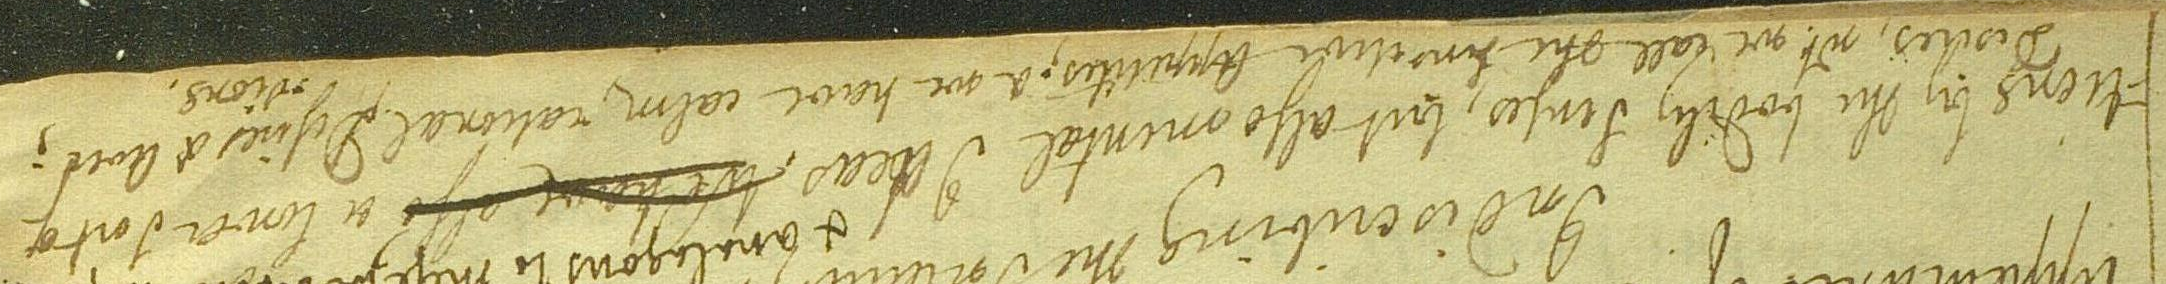-tions by the bodily Senses, but also mental Ideas We have also a lower Sort of
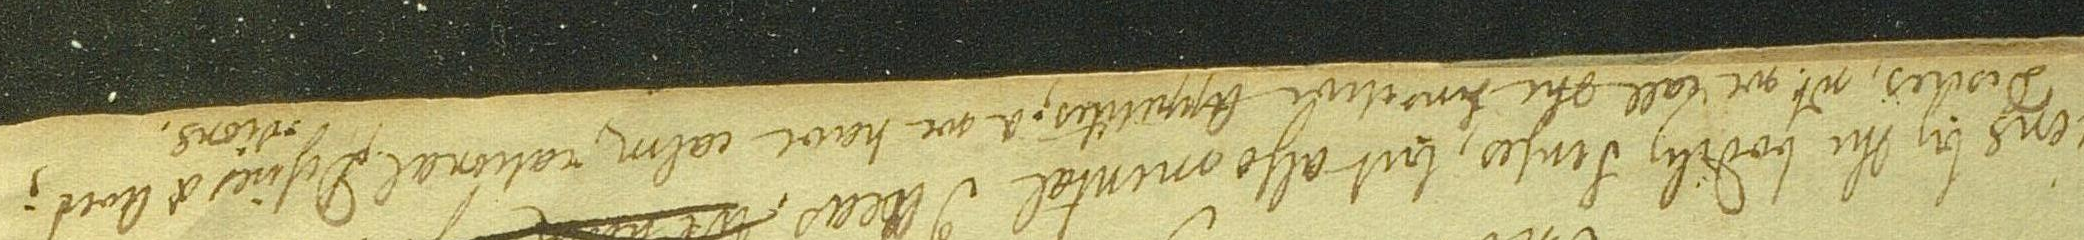Desires, w^h we call the Sensitive Appetites; & we have calm, rational Desires & Aver;
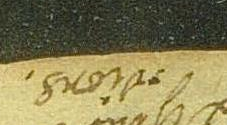sions.
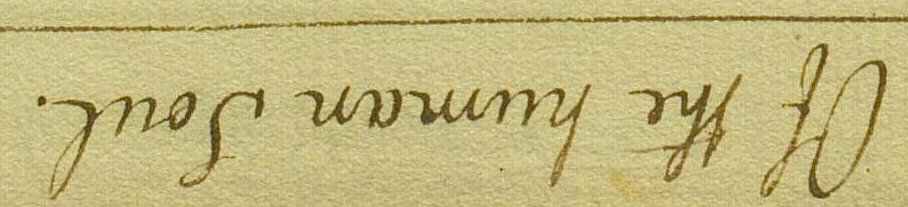the human Soul.
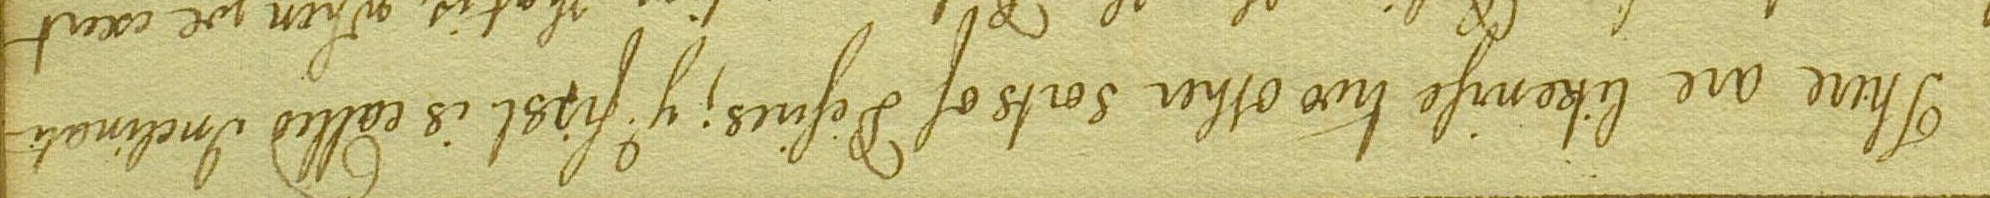There are likewise two other sorts of Desires; y^e first is called Inclinati-
